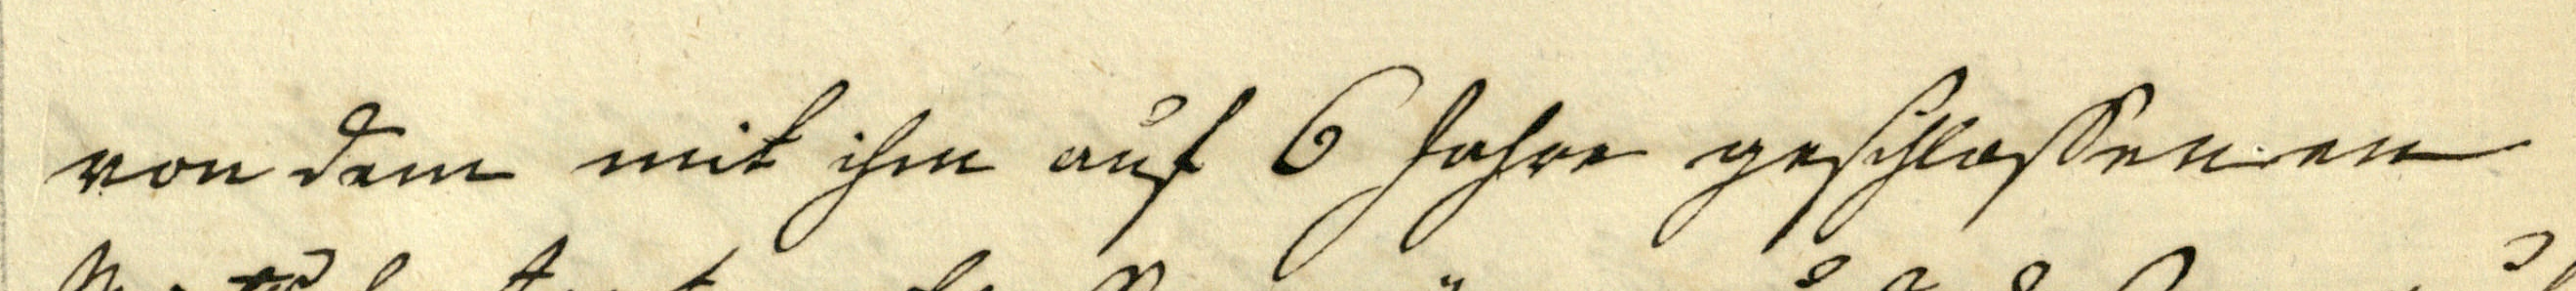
von dem mit ihm auf 6 Jahre geschlossenen
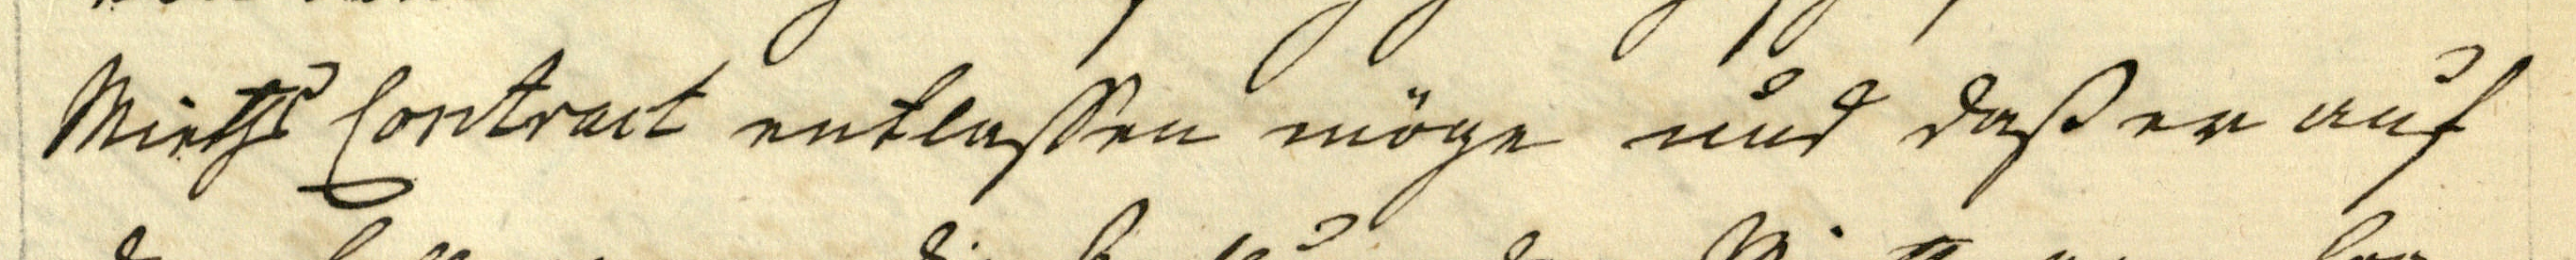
Mieths Contract entlassen möge und daß er auf
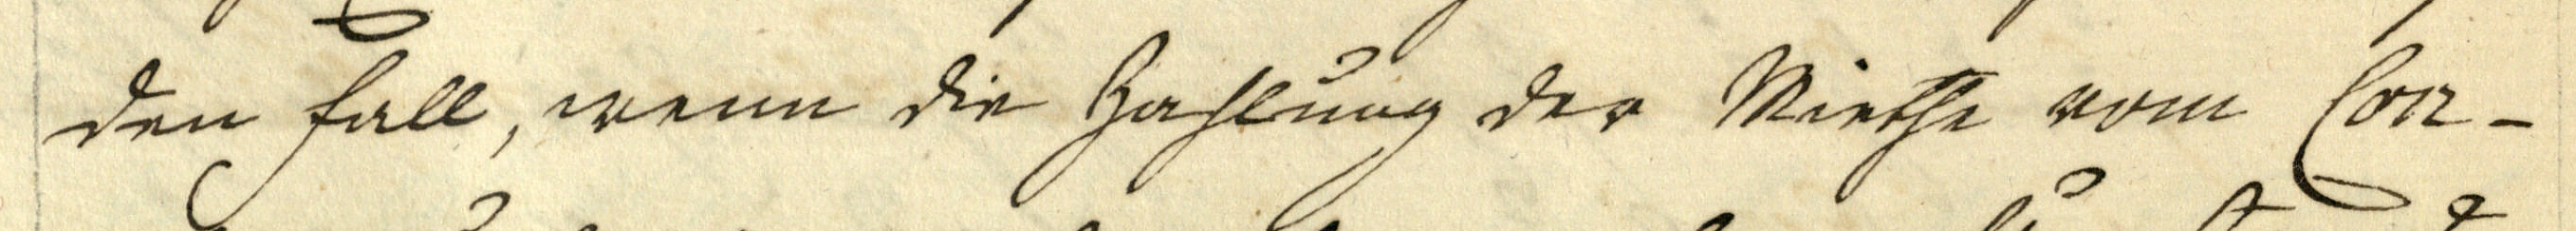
den Fall, wenn die Zahlung der Miethe vom Con¬
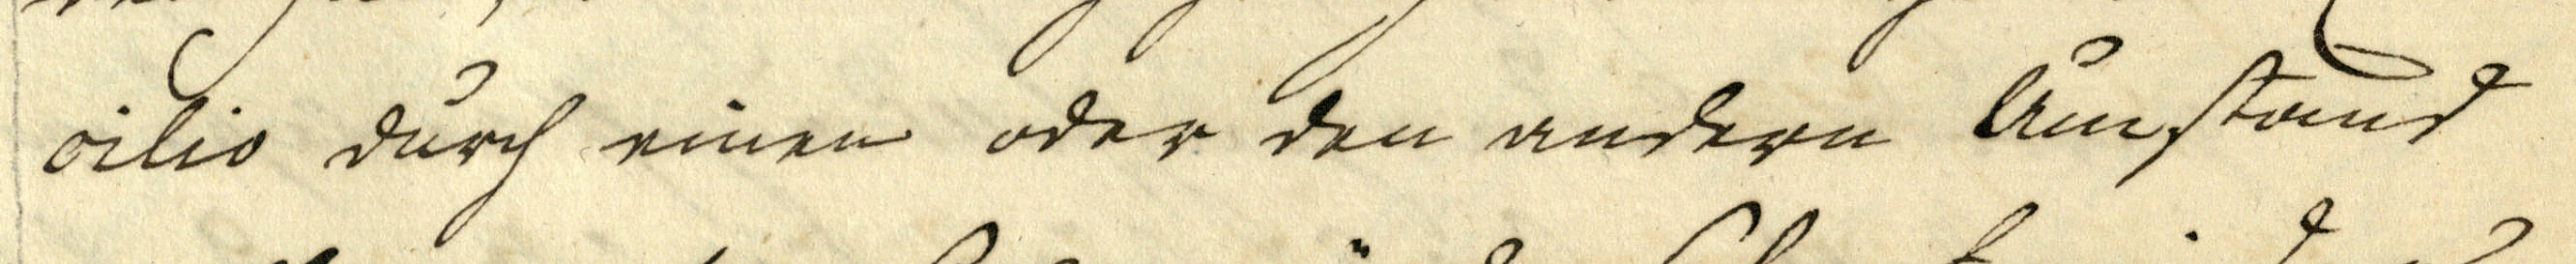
cilio durch einen oder den andern Umstand
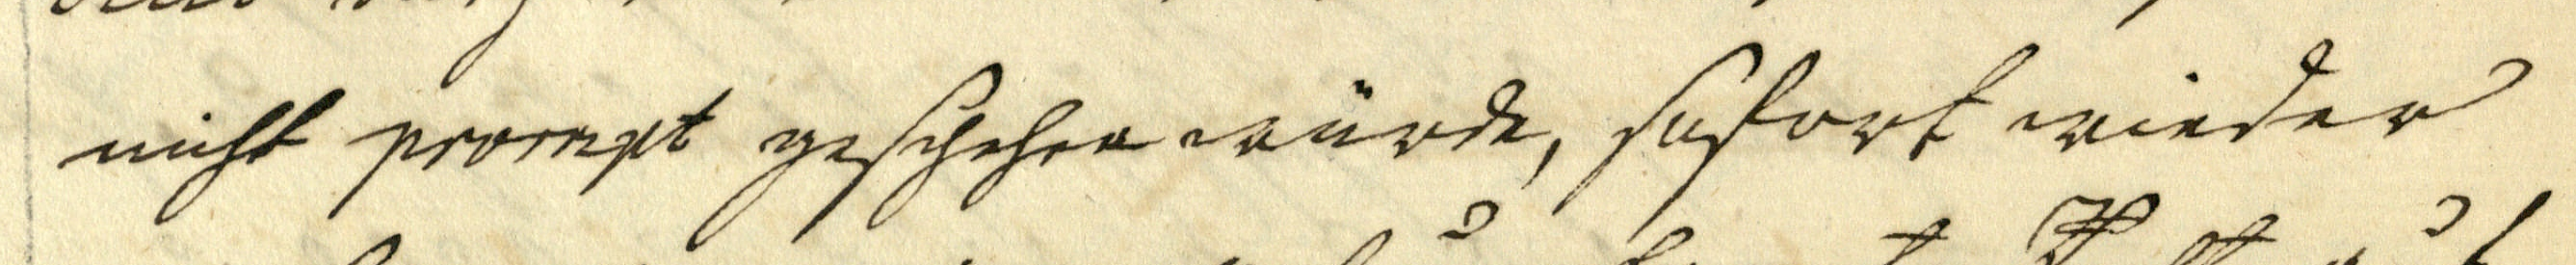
nicht prompt geschehen würde, sofort wieder
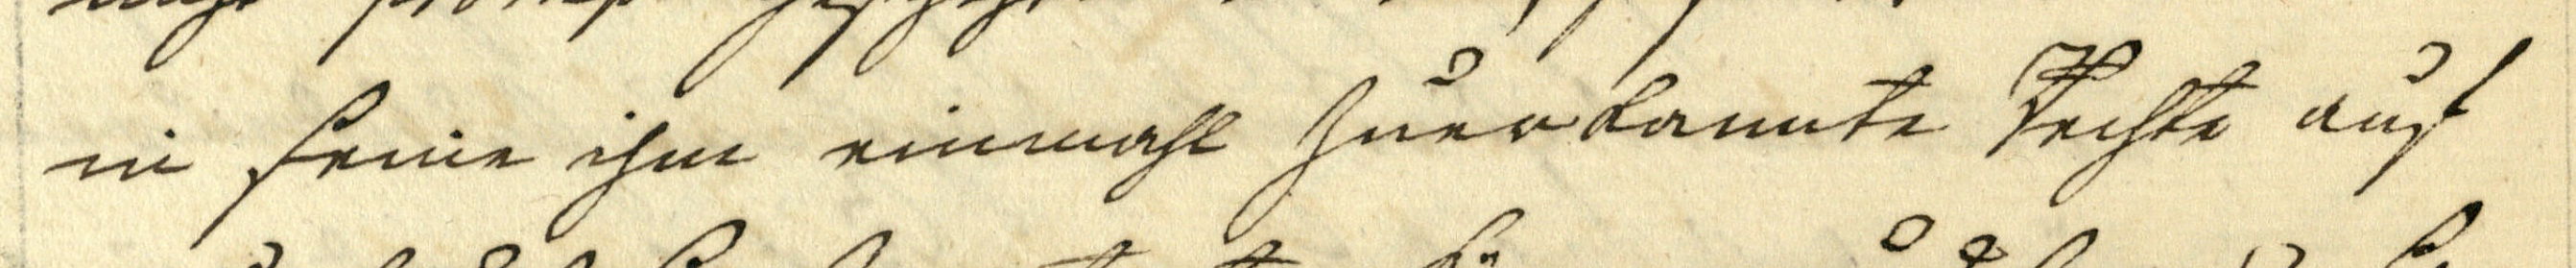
in seine ihm einmahl zuerkannte Rechte auf
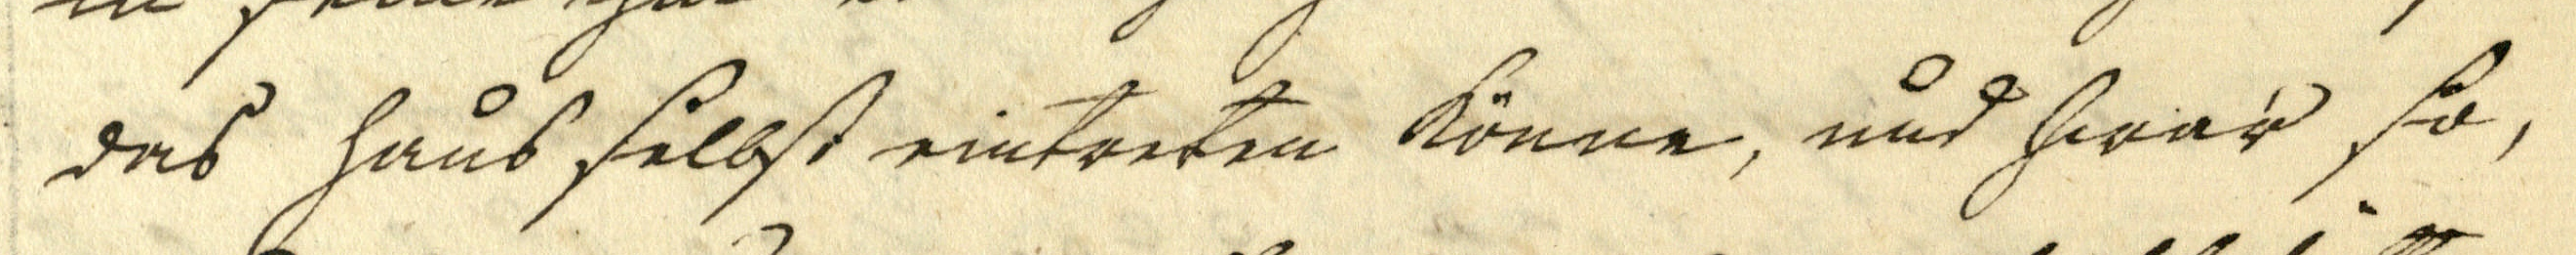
das Haus selbst eintreten könne, und zwar so,
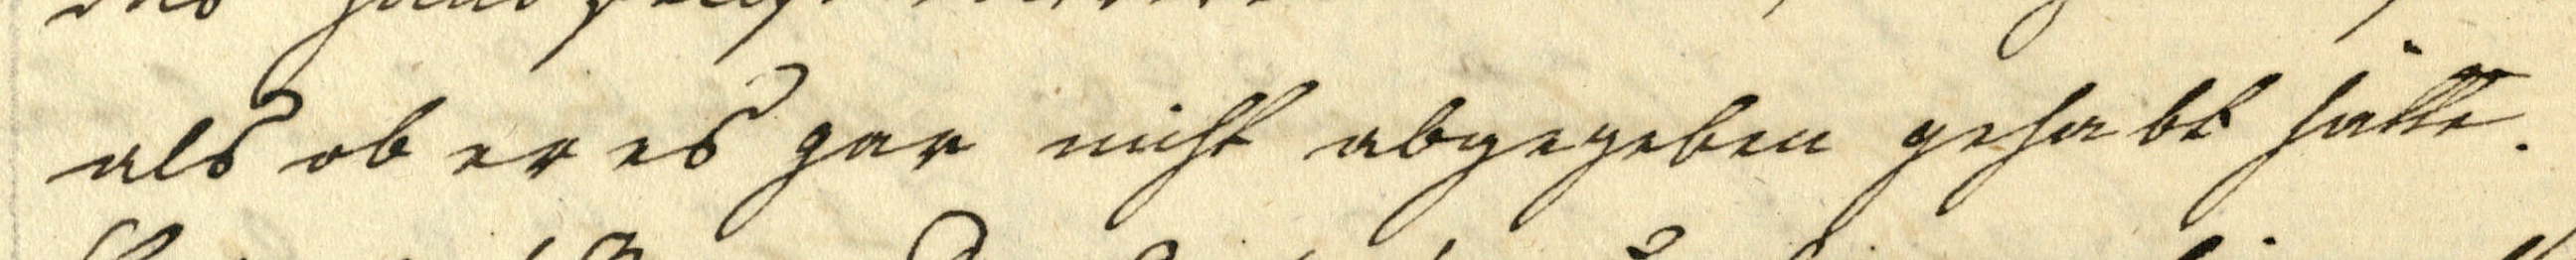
als ob er es gar nicht abgegeben gehabt hätte.
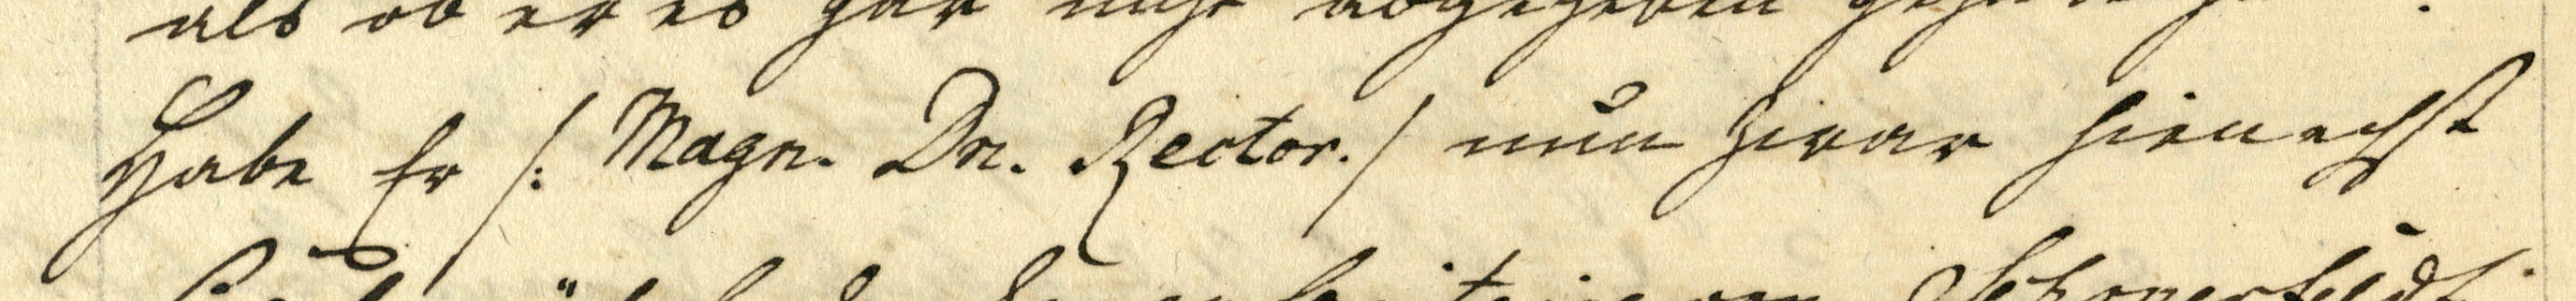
Habe Er /: Magn. Dn. Rector ./ nun zwar hienechst
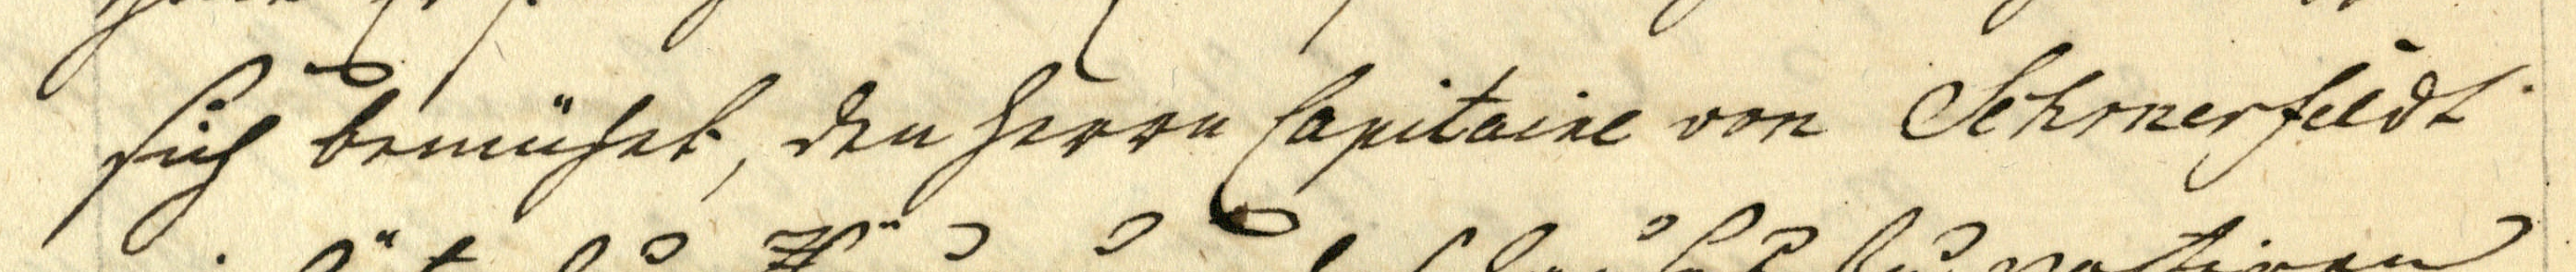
sich bemühet, den Herrn Capitaine von Schmerfeldt
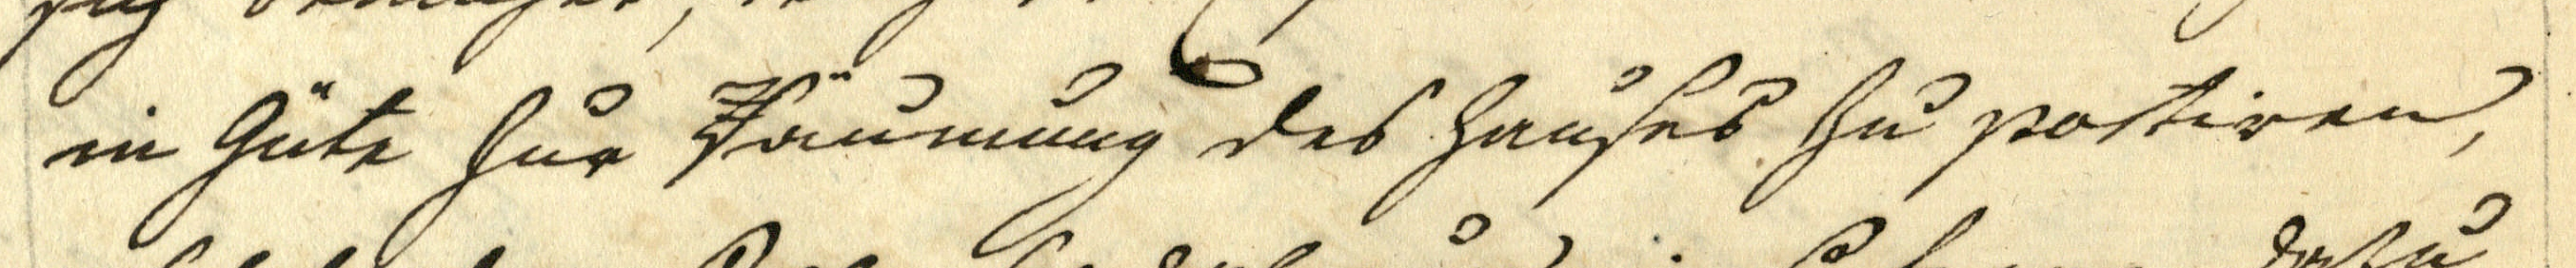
in Güte zur Räumung des Hauses zu portiren,
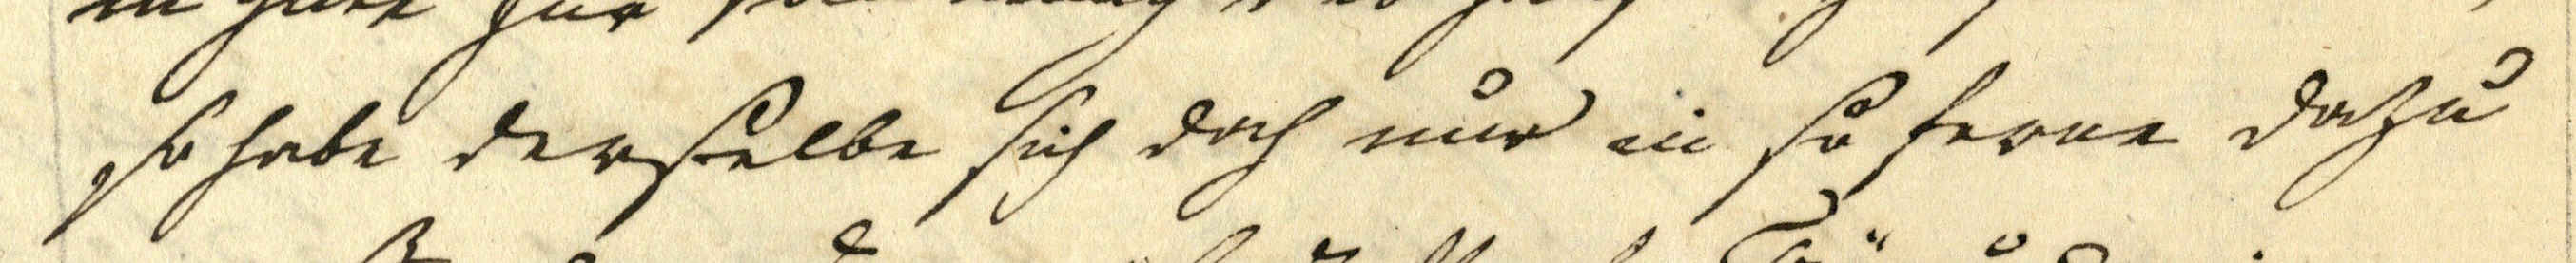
so habe derselbe sich doch nur in so ferne dazu
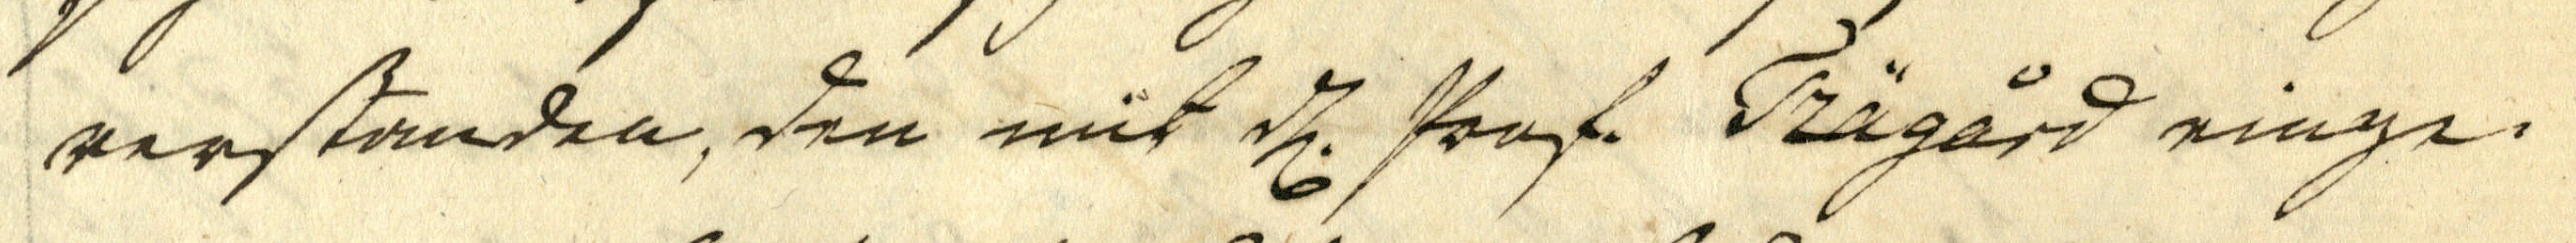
verstanden, den mit dh. Prof. Trägård einge¬
